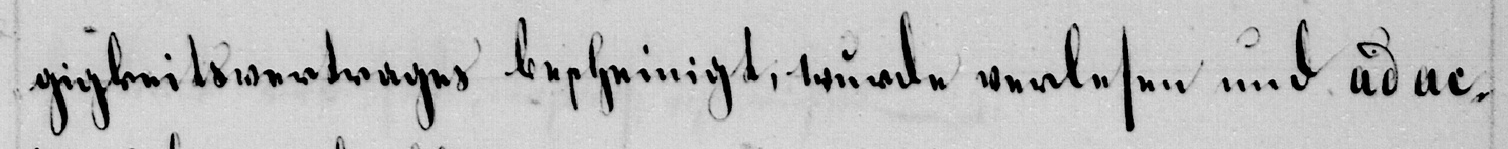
gigkeitsvertrages bescheinigt, wurde verlesen und ad ac¬
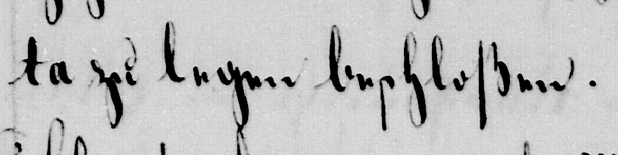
ta zu legen beschloßen.
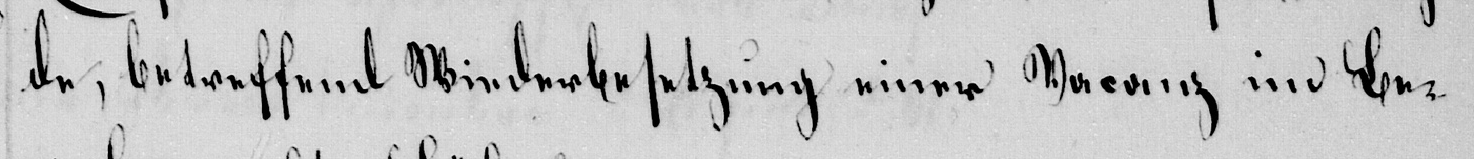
de, betreffend Wiederbesetzung einer Vacanz im Be¬
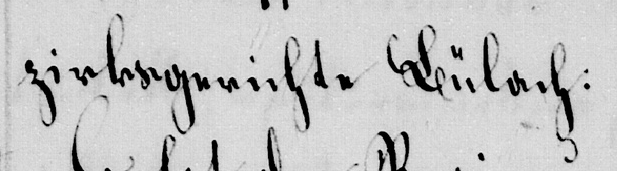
zirksgerichte Bülach.
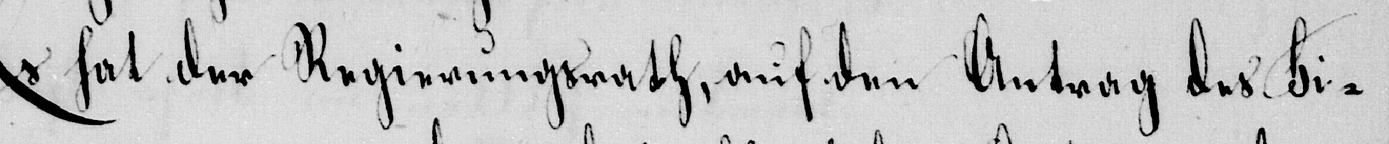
Es hat der Regierungsrath, auf den Antrag des Fi¬
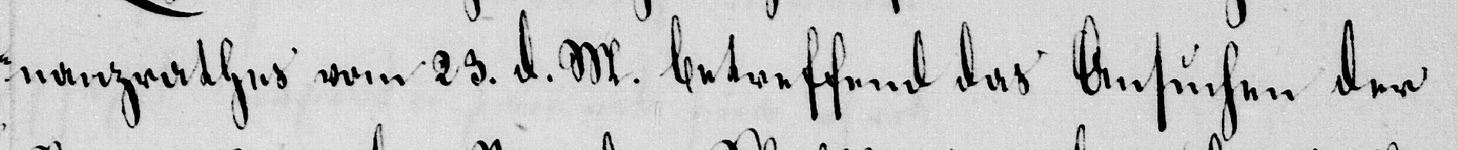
nanzrathes vom 23. d. M. betreffend das Ansuchen der
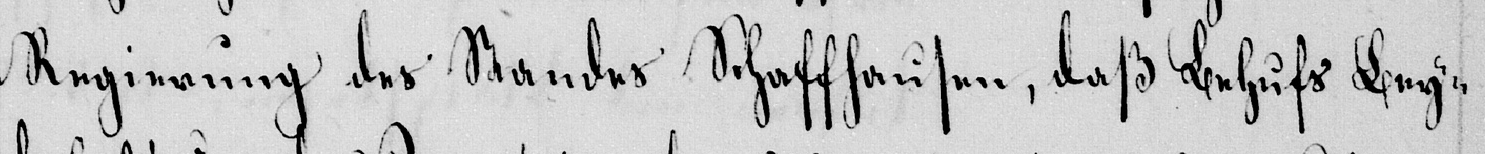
Regierung des Standes Schaffhausen, daß Behufs Bey¬
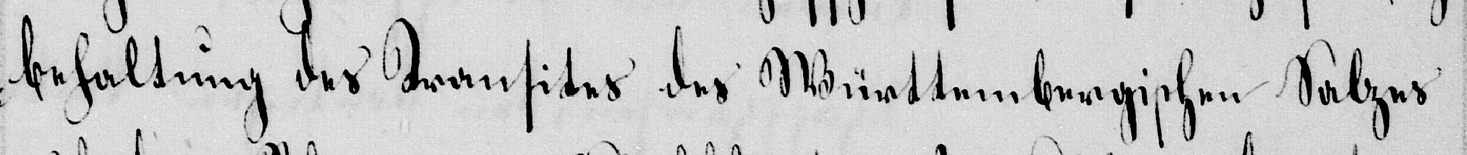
behaltung des Transites des Württembergischen Salzes
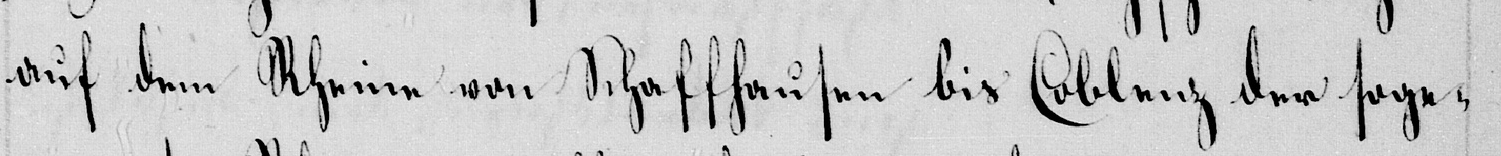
auf dem Rhein von Schaffhausen bis Coblenz der soge¬
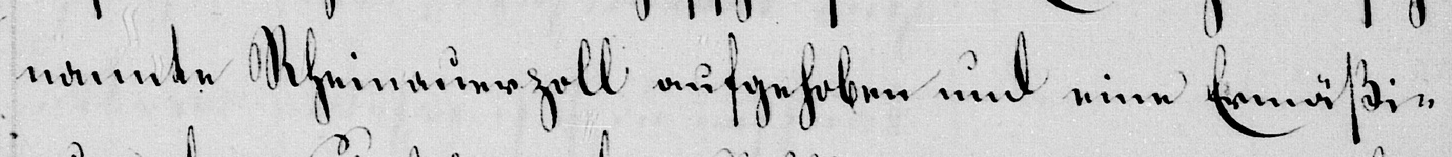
nannten Rheinauerzoll aufgehoben und eine Ermäßi¬
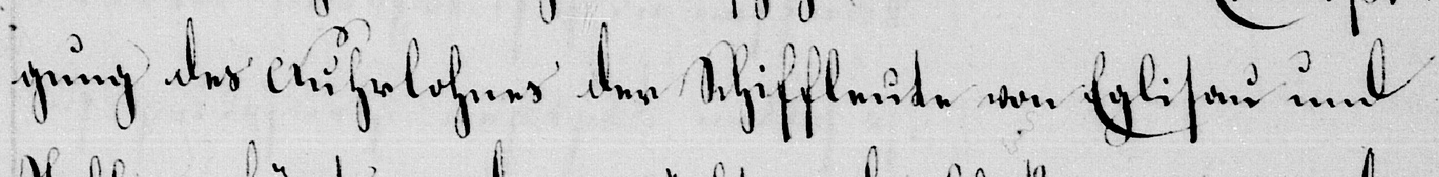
gung des Fuhrlohnes der Schiffleute von Eglisau und
